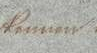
kennen
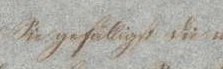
Sie gefälligst die neue
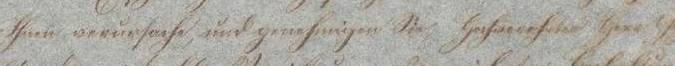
Ihnen verursache, und genehmigen Sie, Hochverehrter Herr
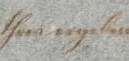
Herrenhauses
